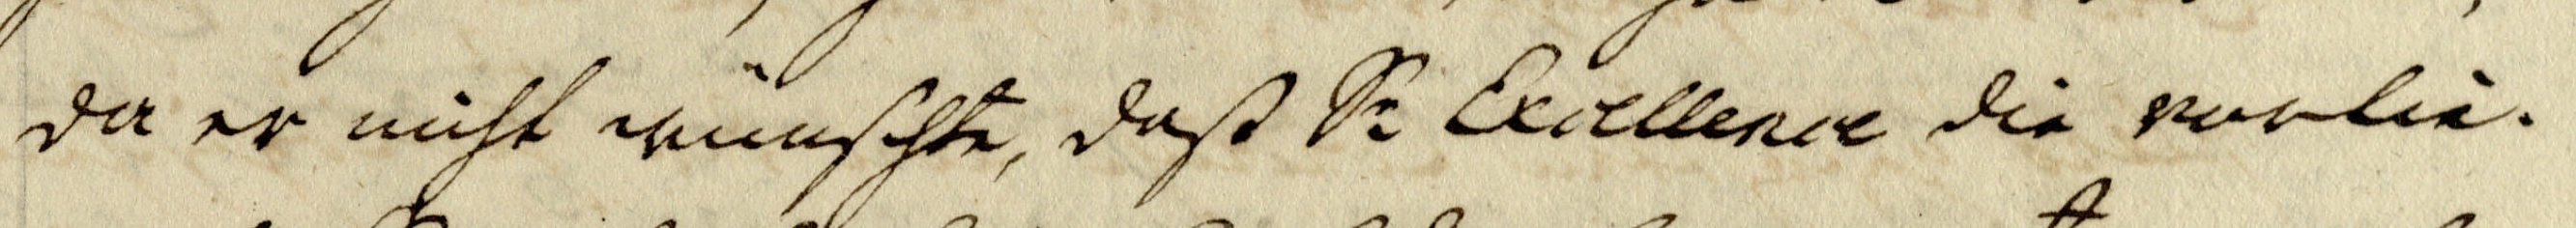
da er nicht wünschte, daß Sr Excellence die vorlie¬
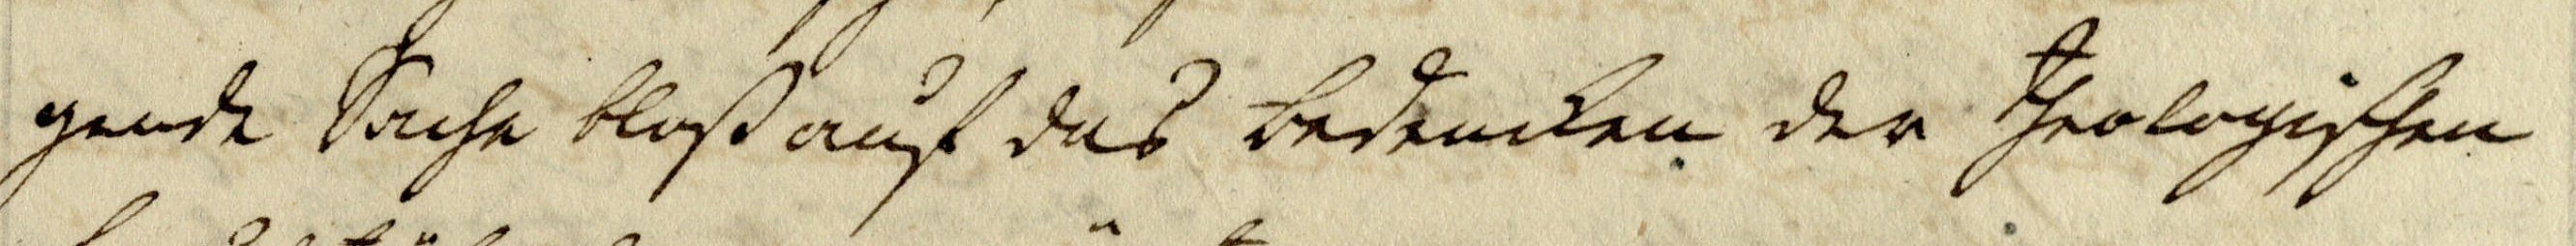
gende Sache bloß auf das Bedencken der Theologischen
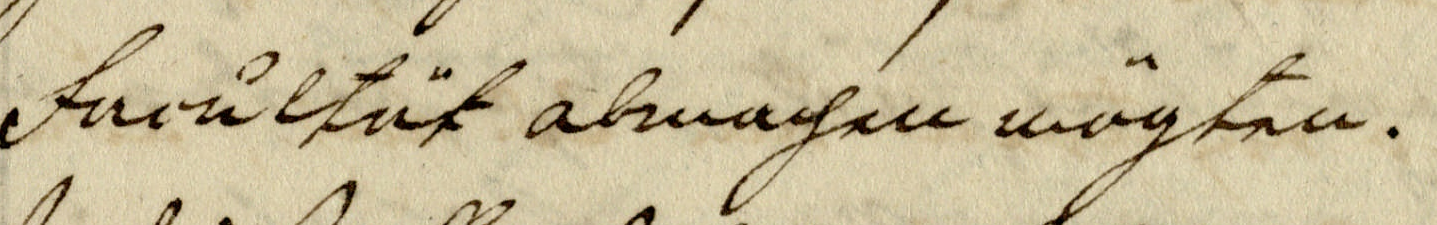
Facultät abmachen mögten.
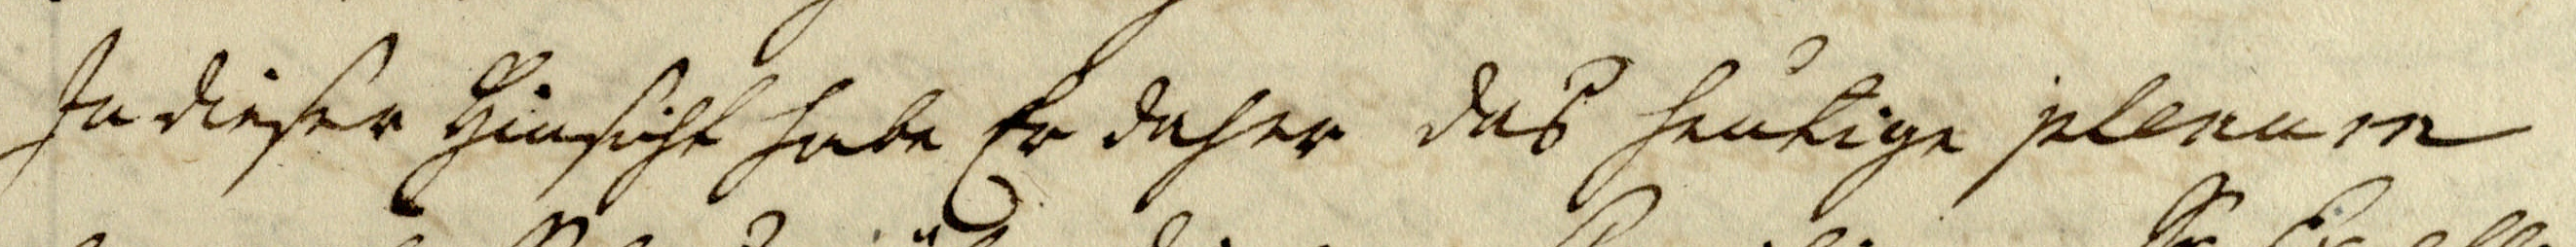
In dieser Hinsicht habe Er daher das heutige plenum
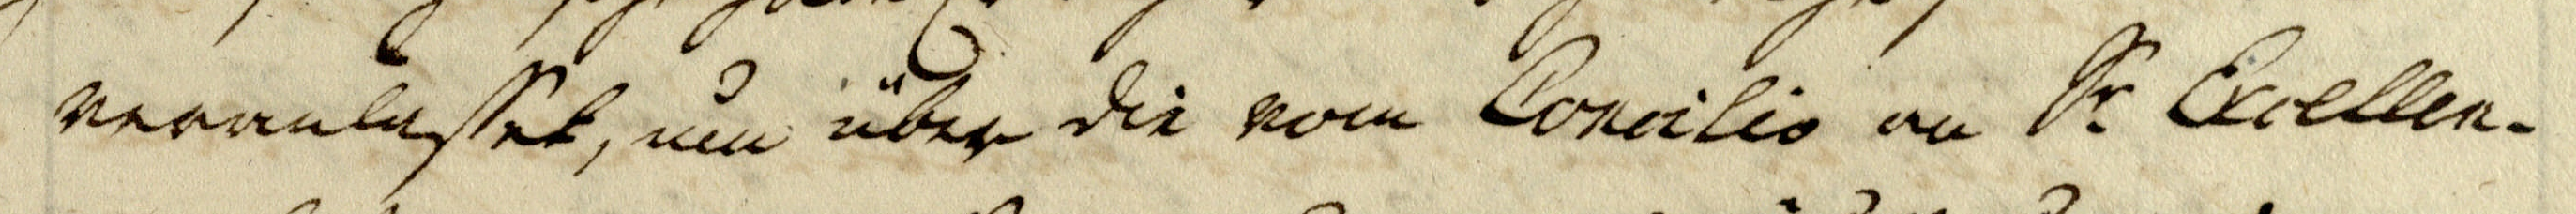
veranlasset, um über die vom Concilio an Sr. Excellen¬
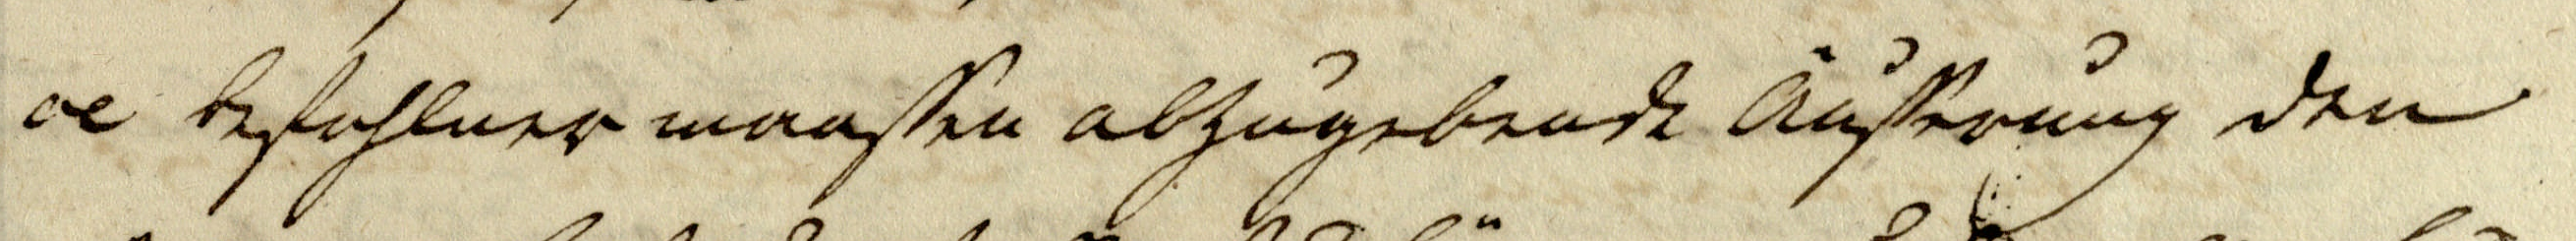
ce befohlnermaassen abzugebende Äusserung den
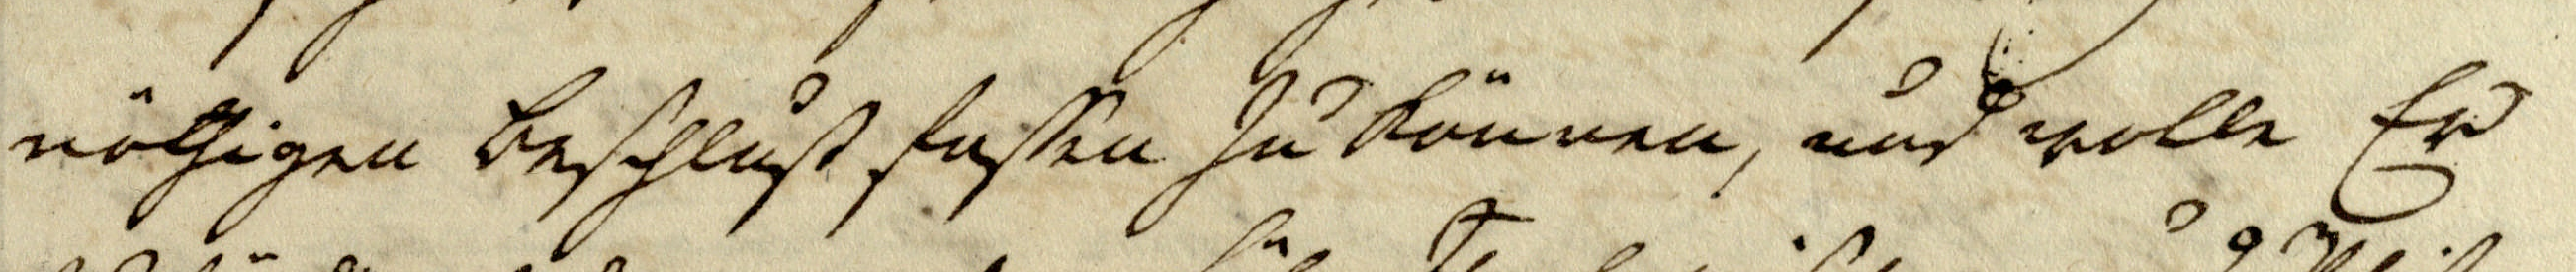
nöthigen Beschluß fassen zu können, und wolle Er
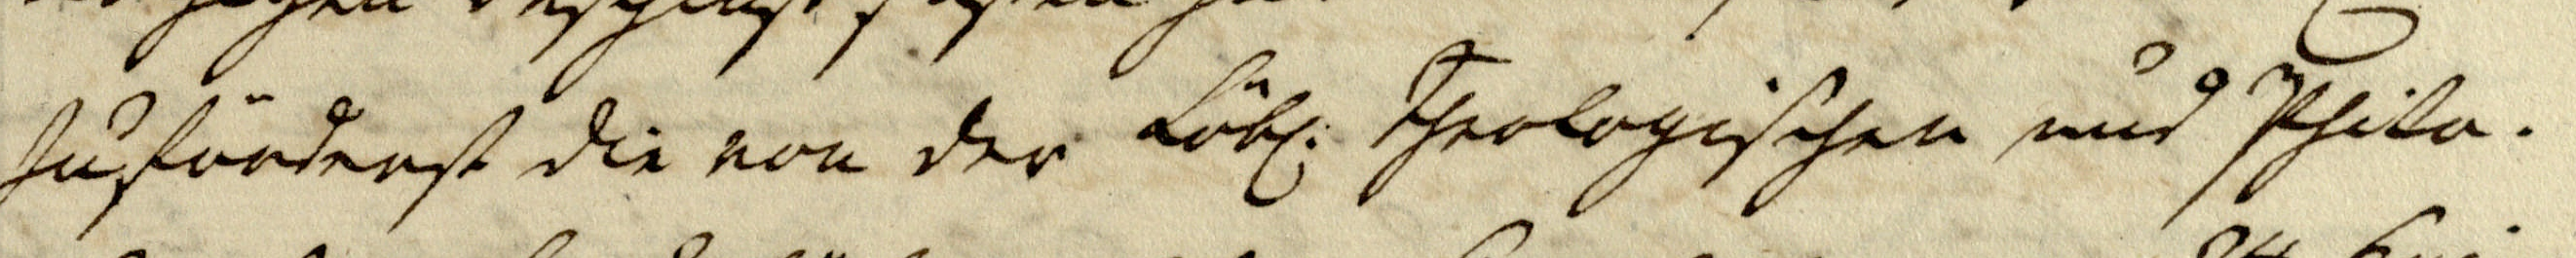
zuförderst die von der Löbl. Theologischen und Philo¬
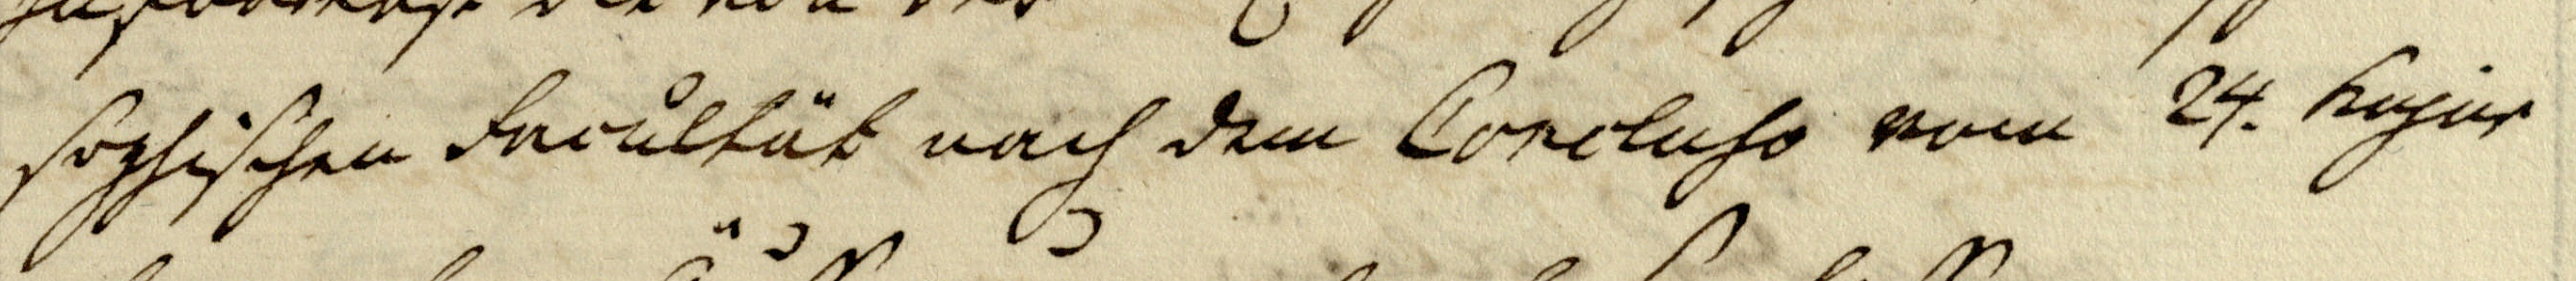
sophischen Facultät nach dem Concluso vom 24. hujus
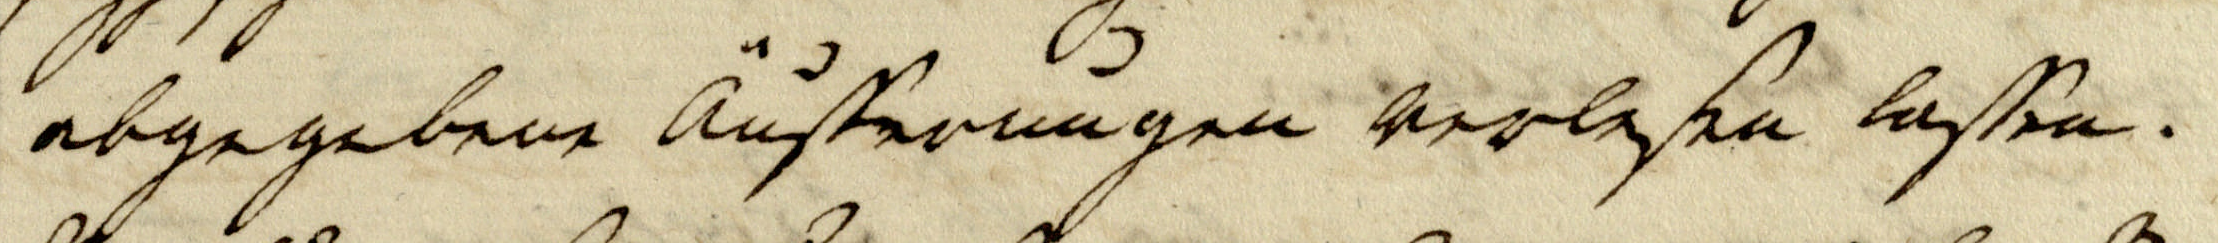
abgegebene Äusserungen verlesen lassen.
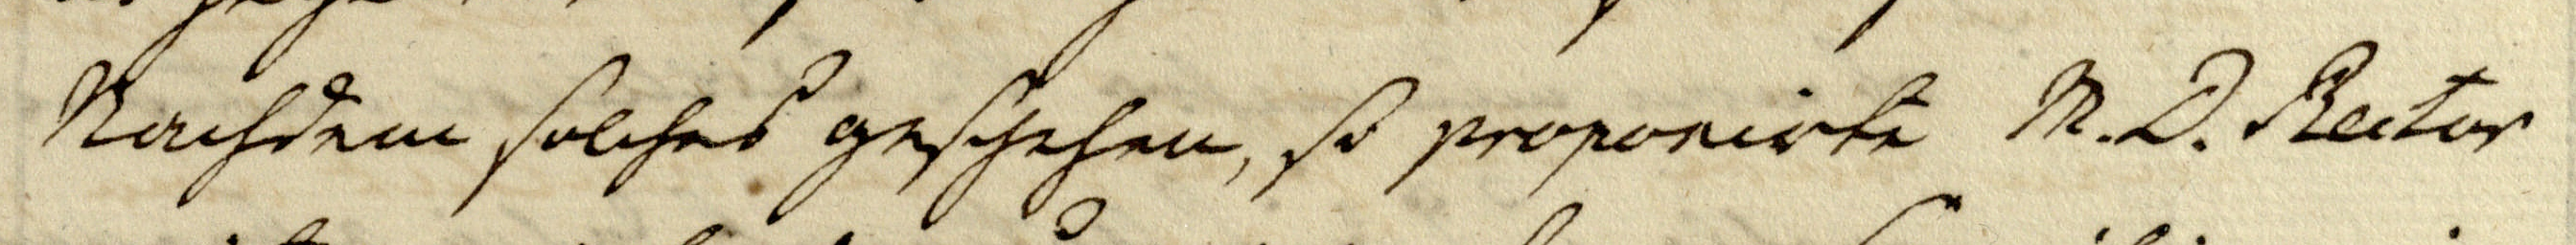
Nachdem solches geschehen, so proponirte M. D. Rector
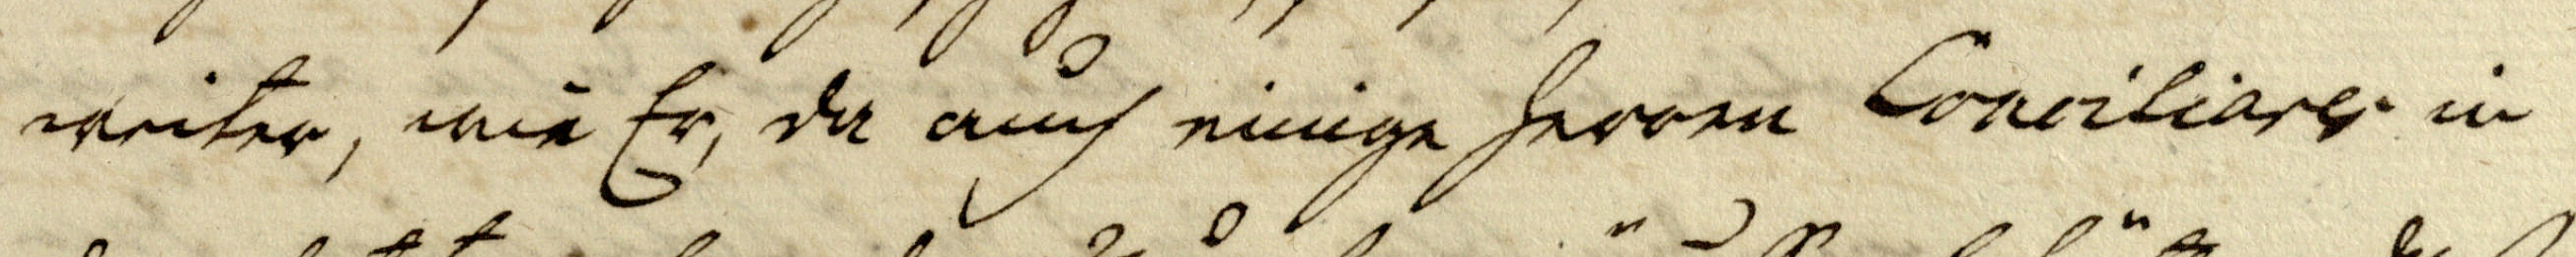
weiter, wie Er, da auch einige Herren Conciliares in
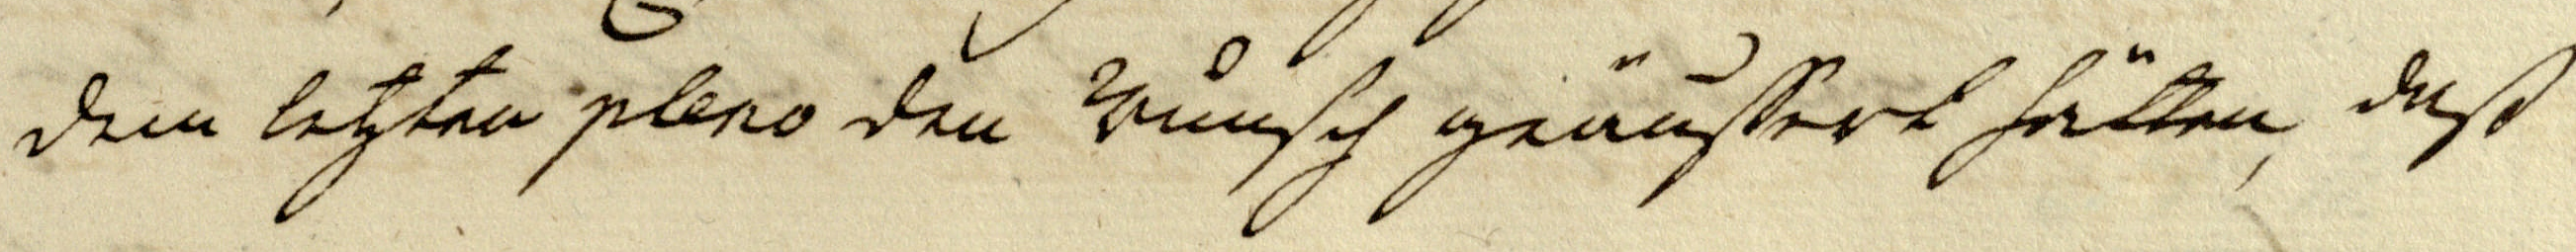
dem letzten pleno den Wunsch geäussert hätten, daß
